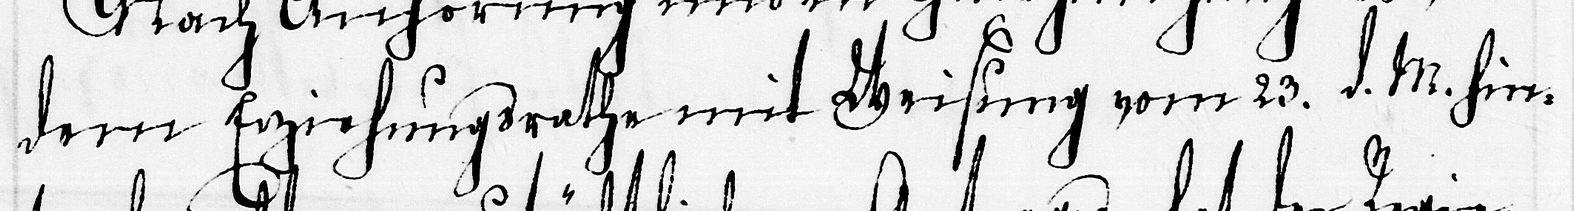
dem Erziehungsrathe mit Weisung vom 23. d. M. hin¬
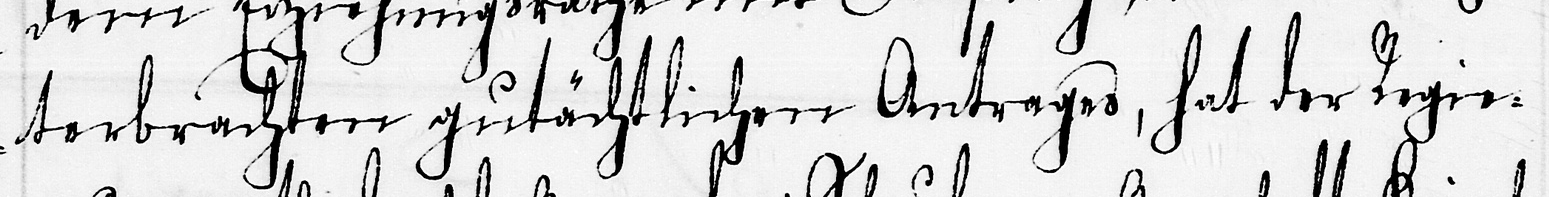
terbrachten gutächtlichen Antrages, hat der Regie¬
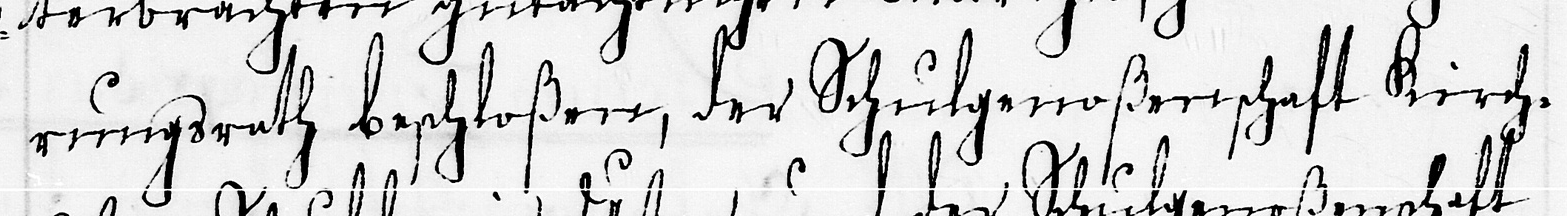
rungsrath beschloßen, der Schulgenoßenschaft Kirch¬
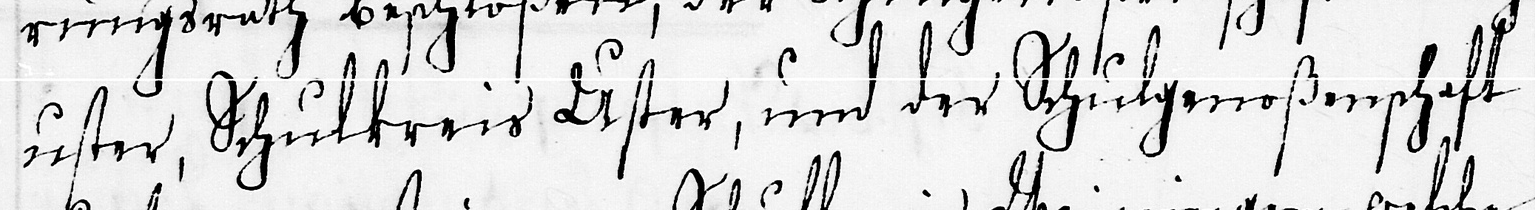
uster, Schulkreis Uster, und der Schulgenoßenschaft
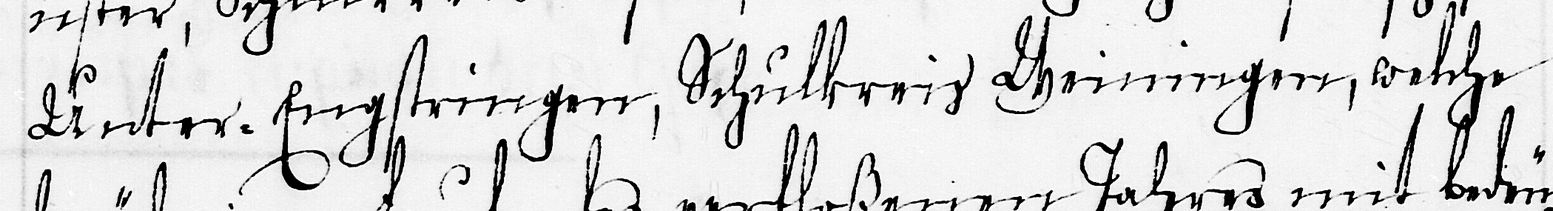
Unter-Engstringen, Schulkreis Weiningen, welche
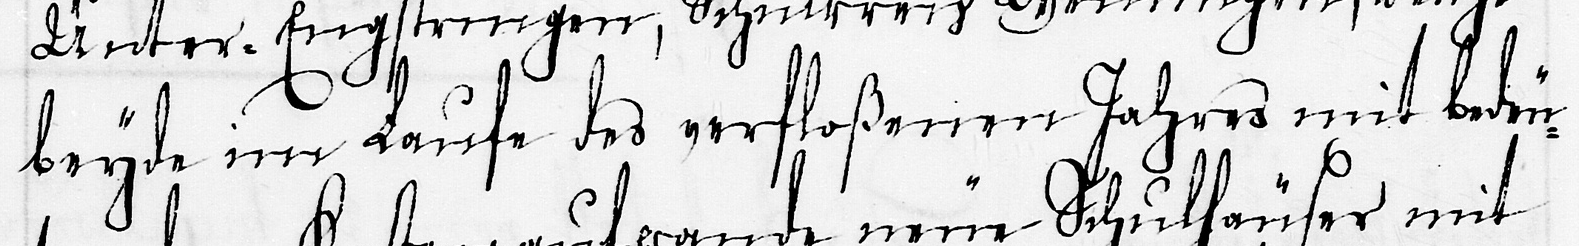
beyde im Laufe des verfloßenen Jahres mit bedeu¬
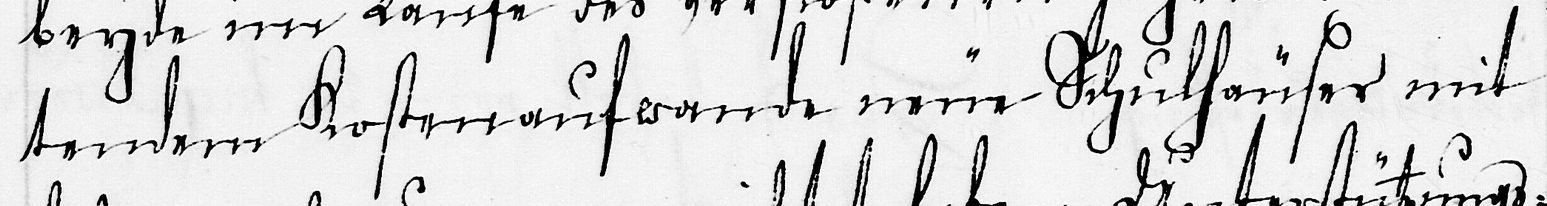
tendem Kostenaufwande neue Schulhäuser mit
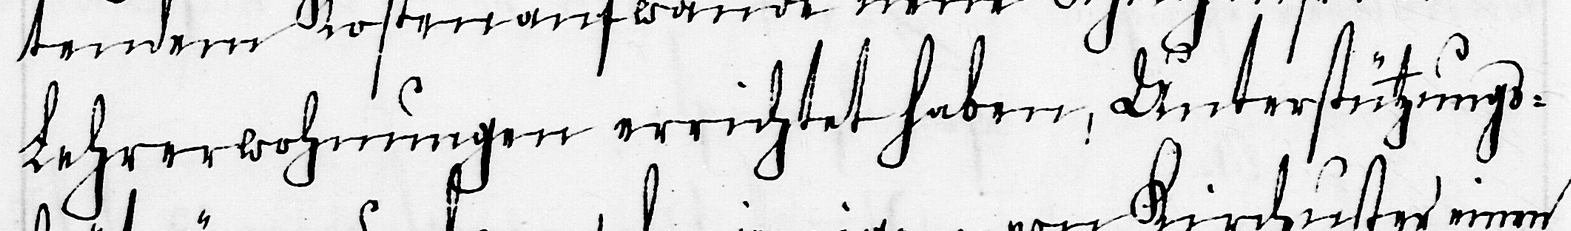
Lehrerwohnungen errichtet haben, Unterstützungs¬
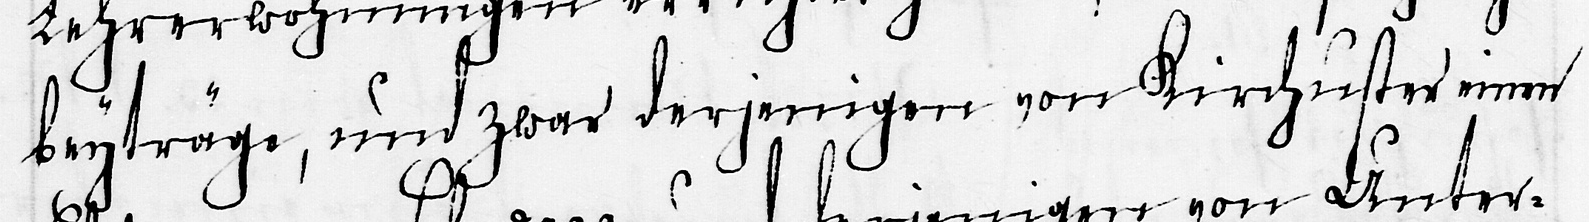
beyträge, und zwar derjenigen von Kirchuster einen
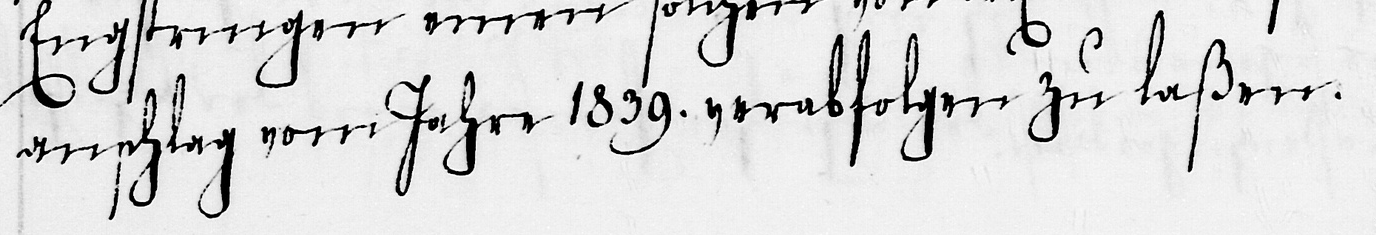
anschlag vom Jahre 1839. verabfolgen zu laßen.
